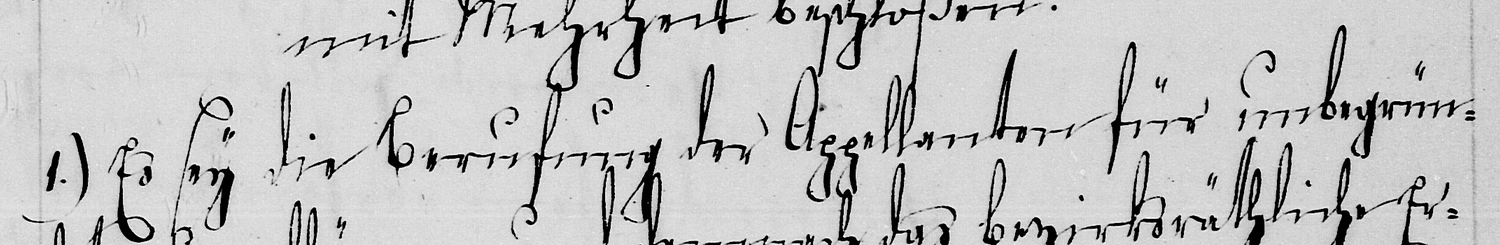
1.) sey die Berufung der Appellanten für unbegrün¬
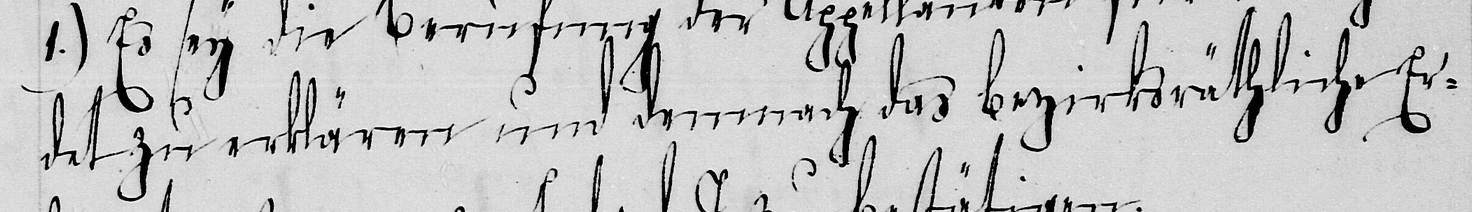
det zu erklären und demnach das bezirksräthliche Er¬
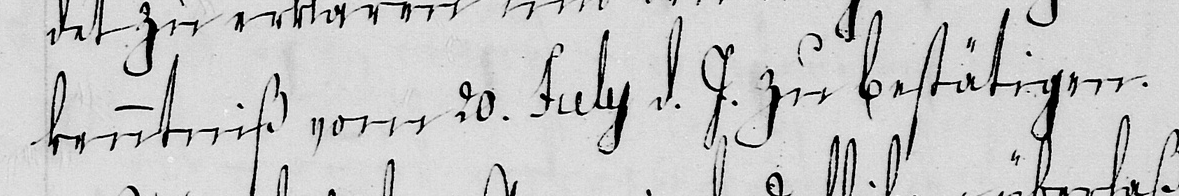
kenntniß vom 20. July d. J. zu bestätigen.
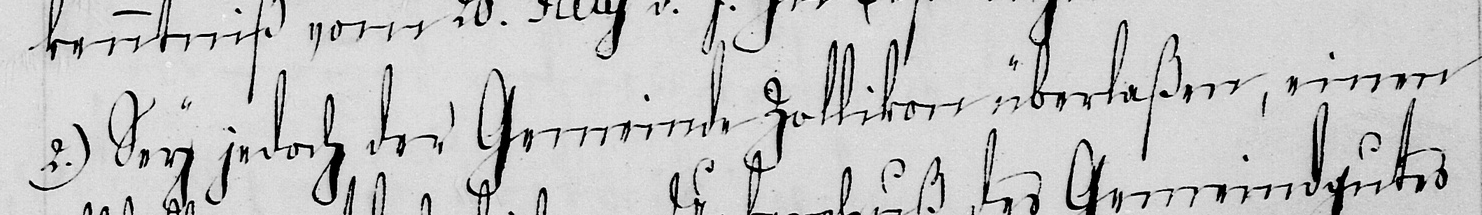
2.) Sey jedoch der Gemeinde Zollikon überlaßen, einen
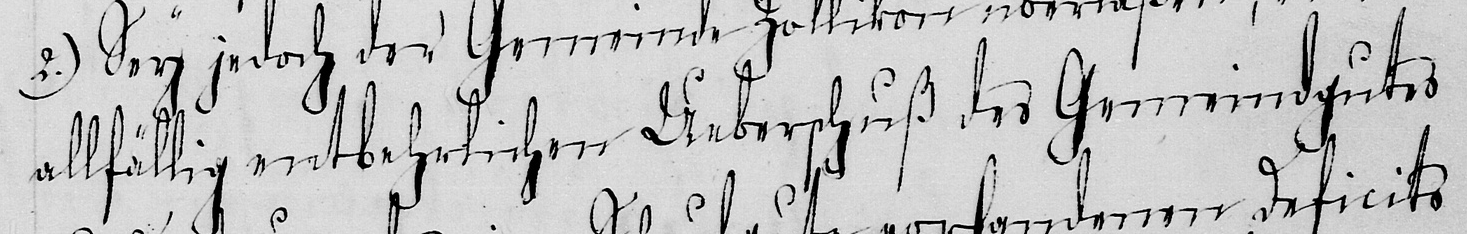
llfällig entbehrlichen Ueberschuß des Gemeindgutes
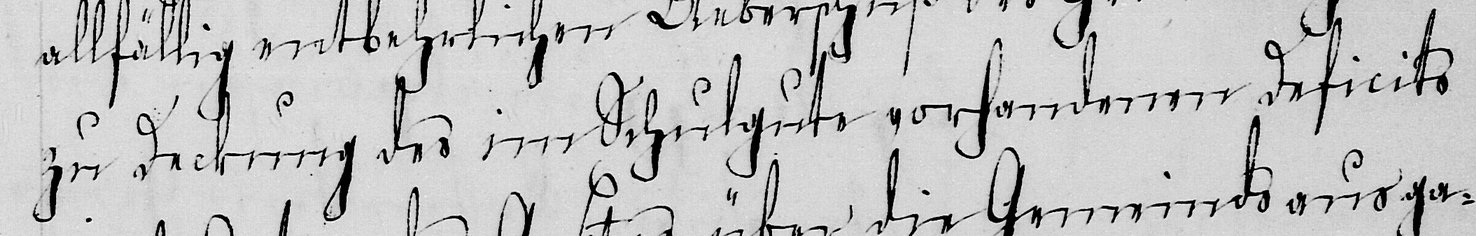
zu Deckung des im Schulgute vorhandenen Deficits
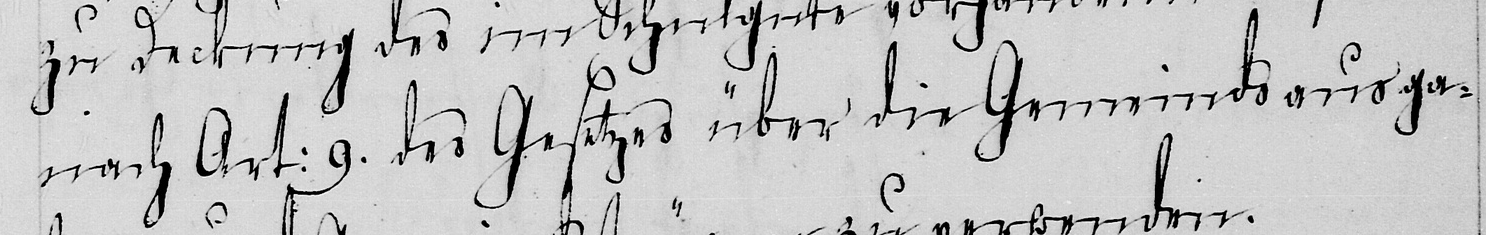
nach Art: 9. des Gesetzes über die Gemeindsausga¬
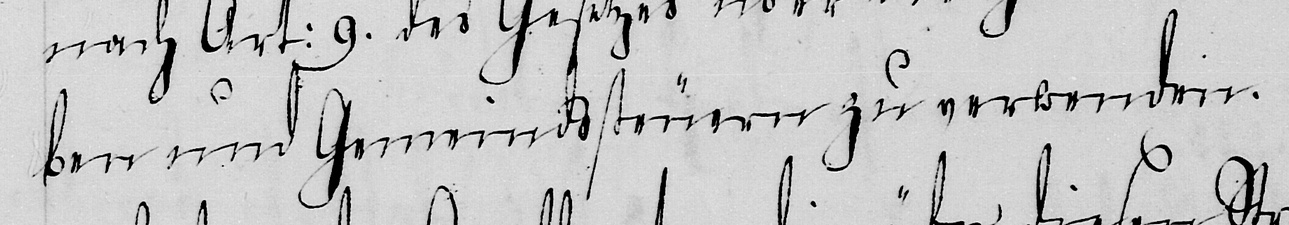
ben und Gemeindssteuern zu verwenden.
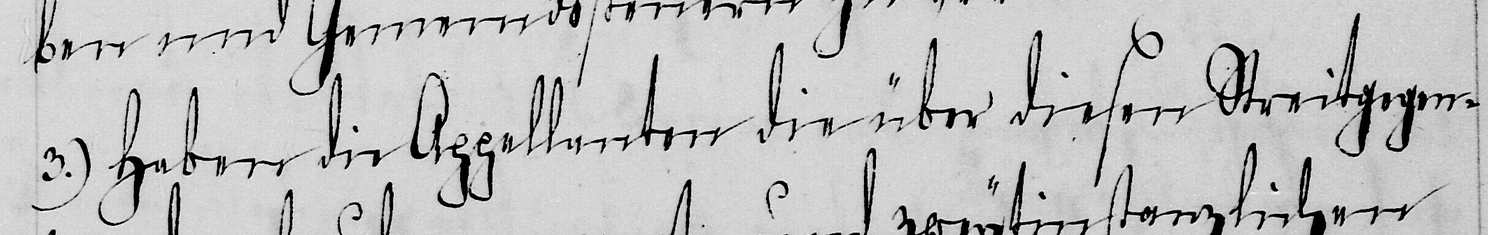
3.) Haben die Appellanten die über diesen Streitgege¬
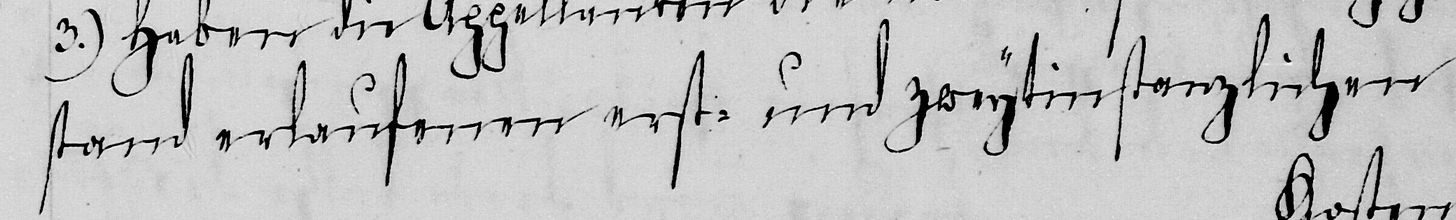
nstand erlaufenen erst- und zweytinstanzlichen
